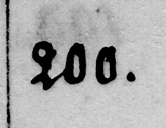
20.
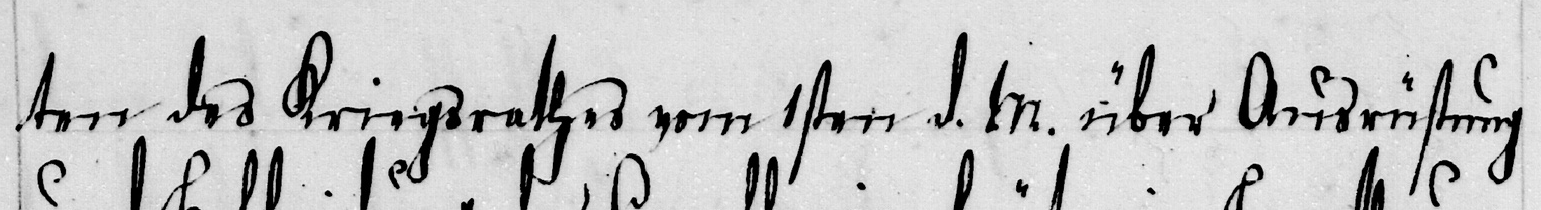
ten des Kriegsrathes vom 1sten d. M. über Ausrüstung
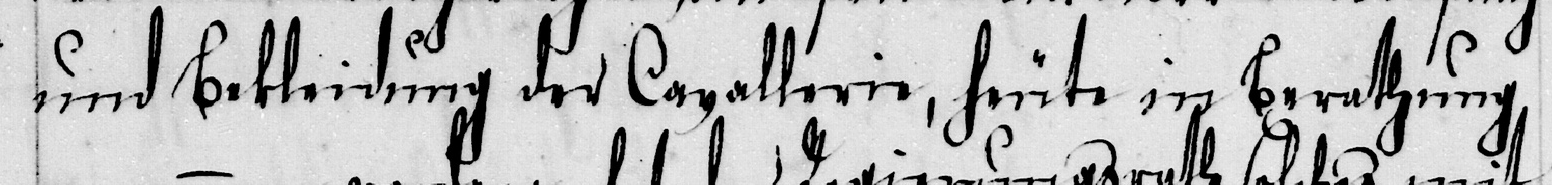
und Bekleidung der Cavallerie, heute in Berathung
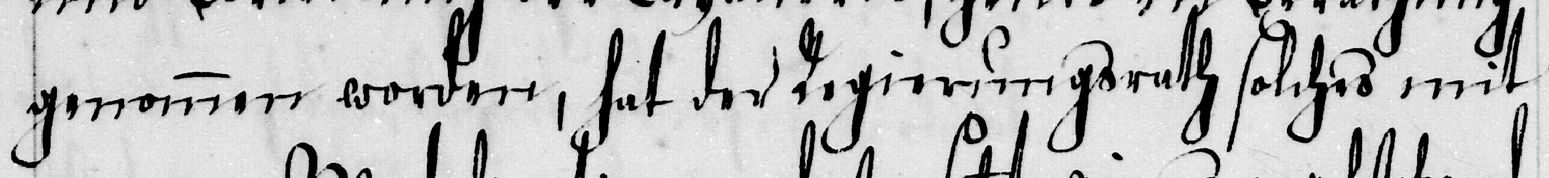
genommen worden, hat der Regierungsrath solches mit
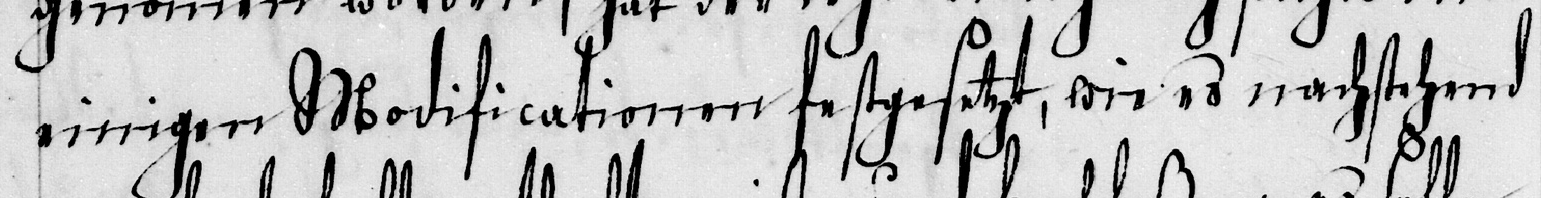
einigen Modificationen festgesetzt, wie es nachstehend
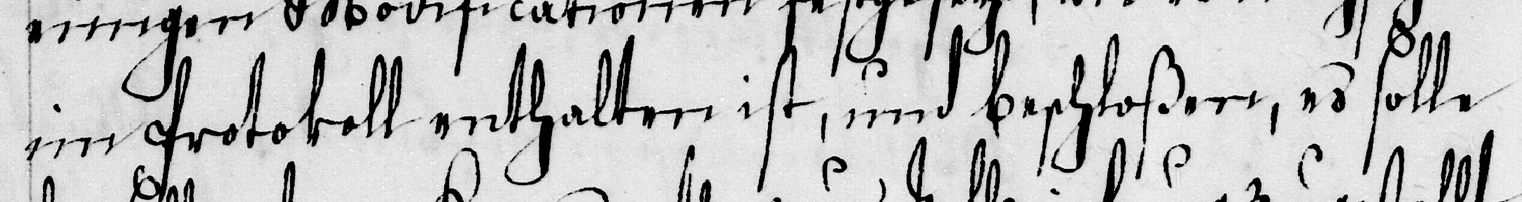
im Protokoll enthalten ist, und beschloßen, es solle
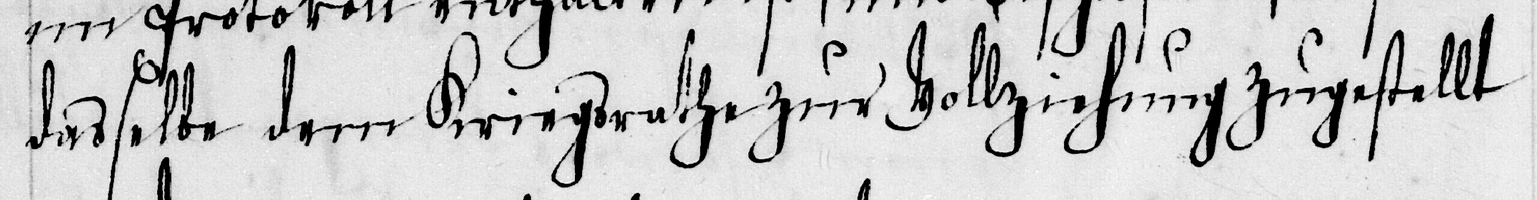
dasselbe dem Kriegsrathe zur Vollziehung zugestellt
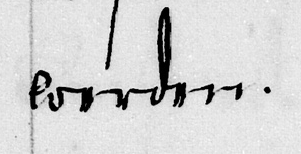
werden.
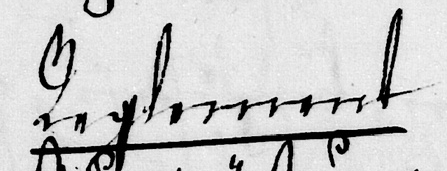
Reglement
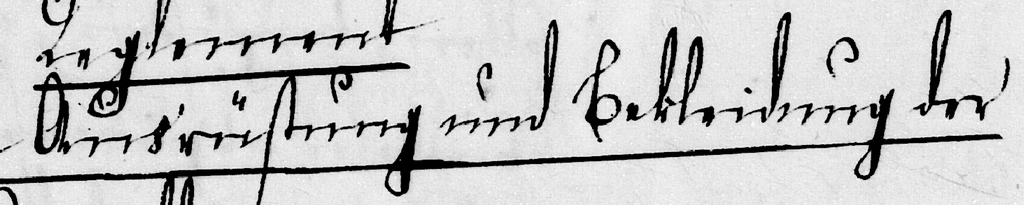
Ausrüstung und Bekleidung der
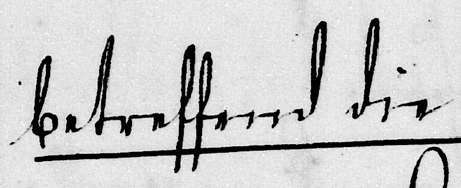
betreffend die
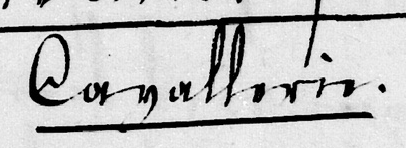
Cavallerie.
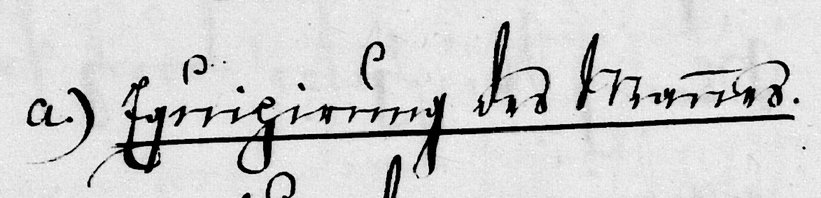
a.) Equipirung des Mannes.
